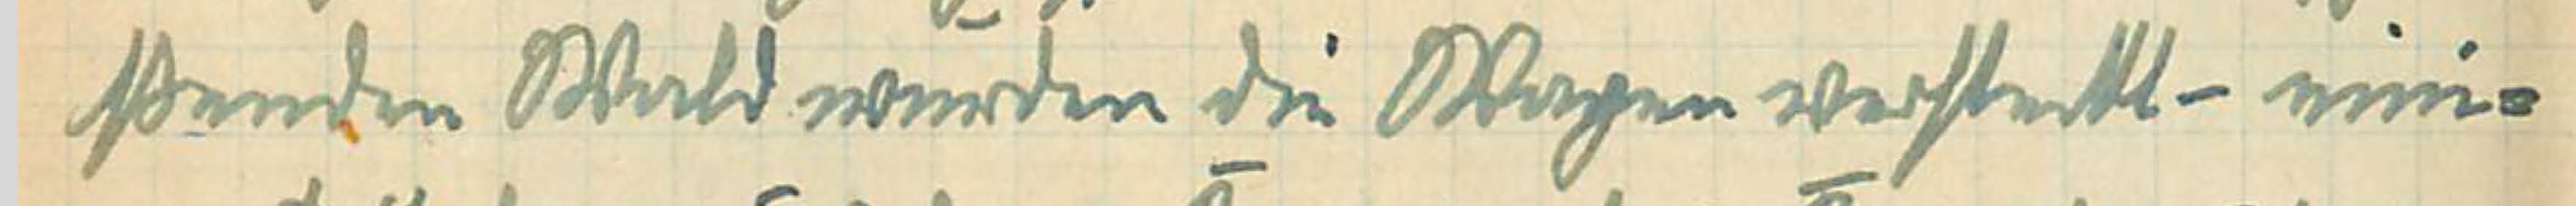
ßenden Wald wurden die Wagen versteckt – eini-
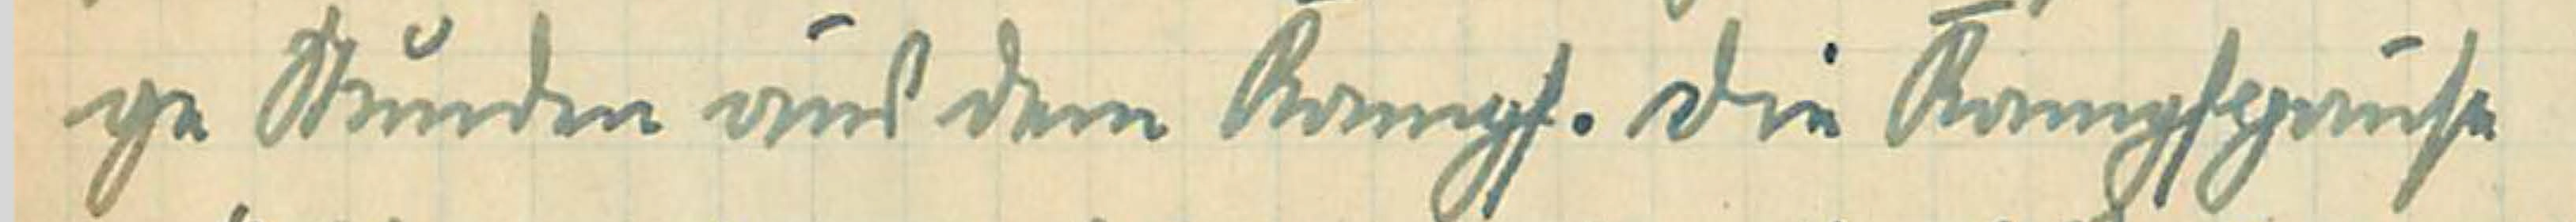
ge Stunden aus dem Kampf. Die Kampfpause
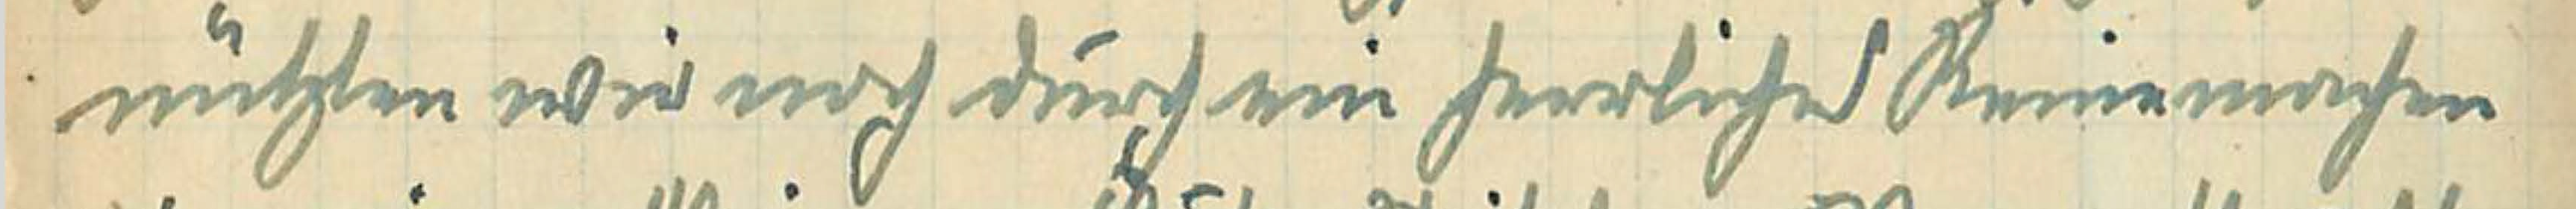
nützten wir noch durch ein herrliches Reinemachen
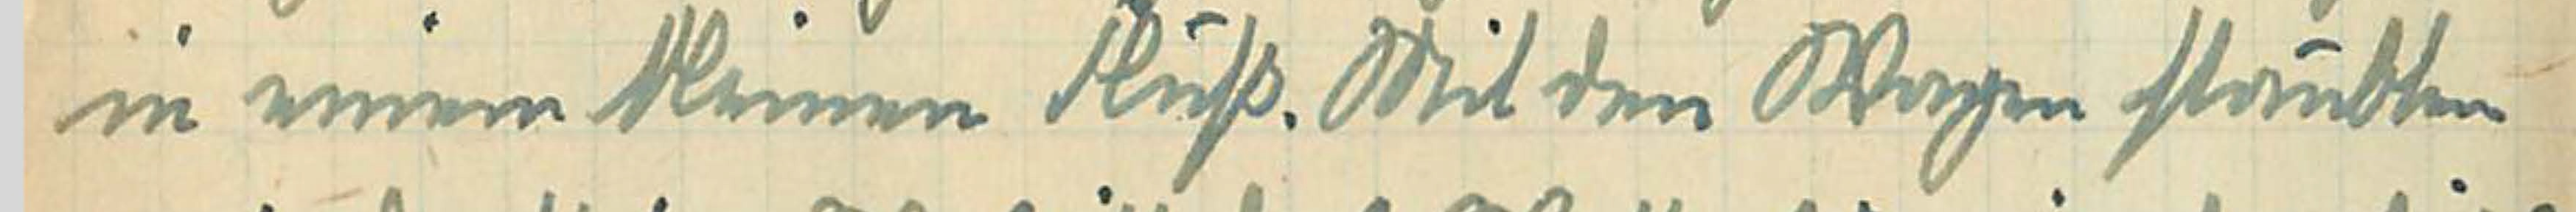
in einem kleinen Fluß. Mit den Wagen staubten
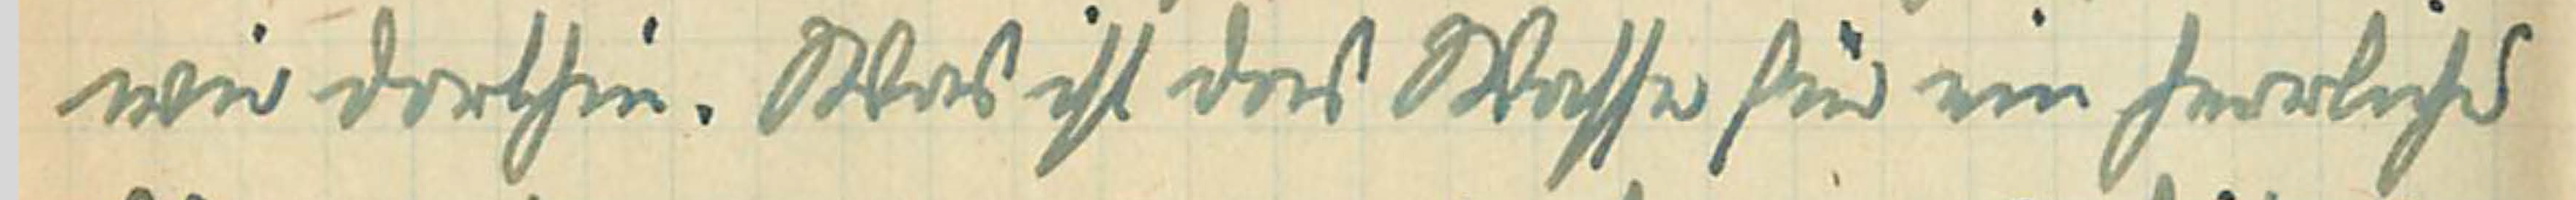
wir dorthin. Was ist das Wasser für ein herrliches
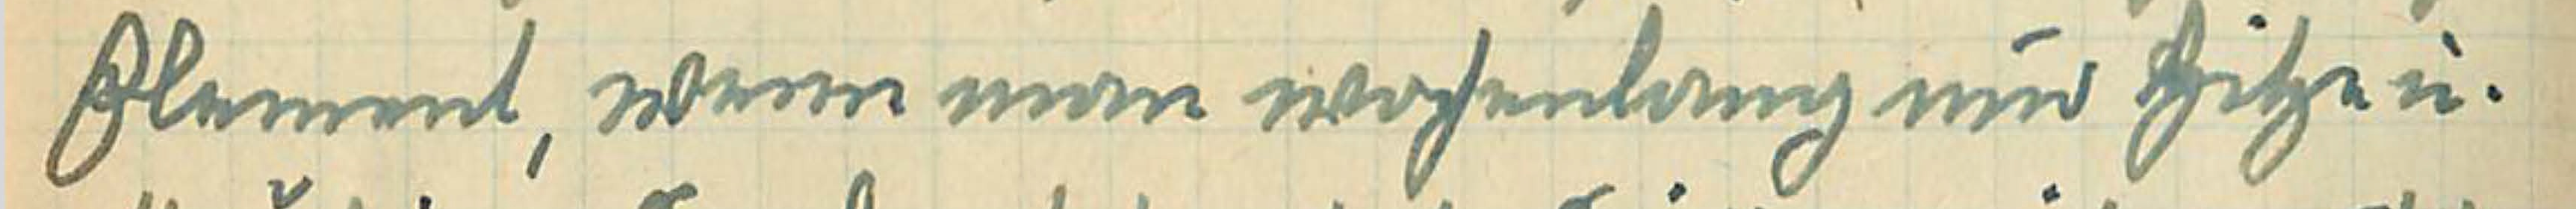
Element, wenn man wochenlang nur Hitze u.
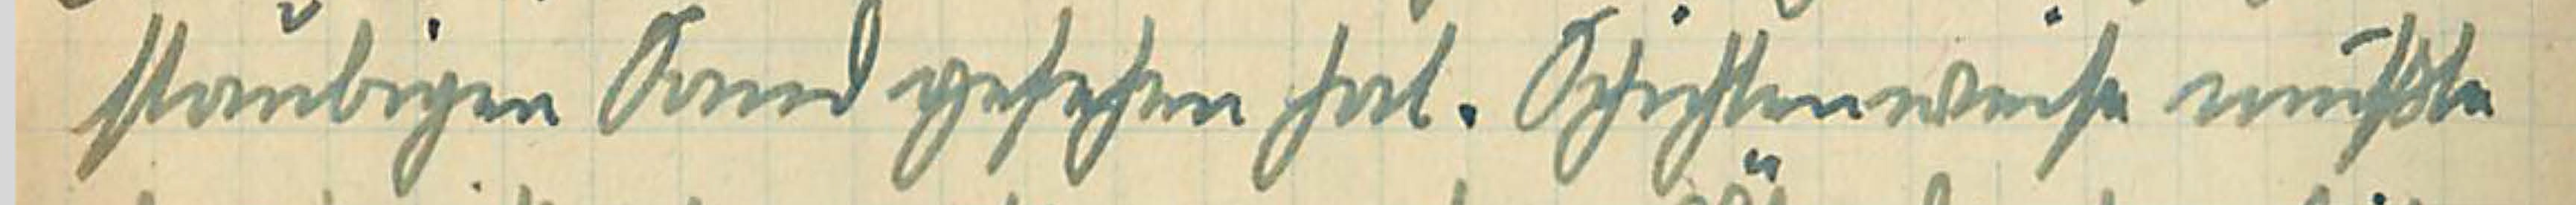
staubigen Sand gesehen hat. Schichtenweise mußte
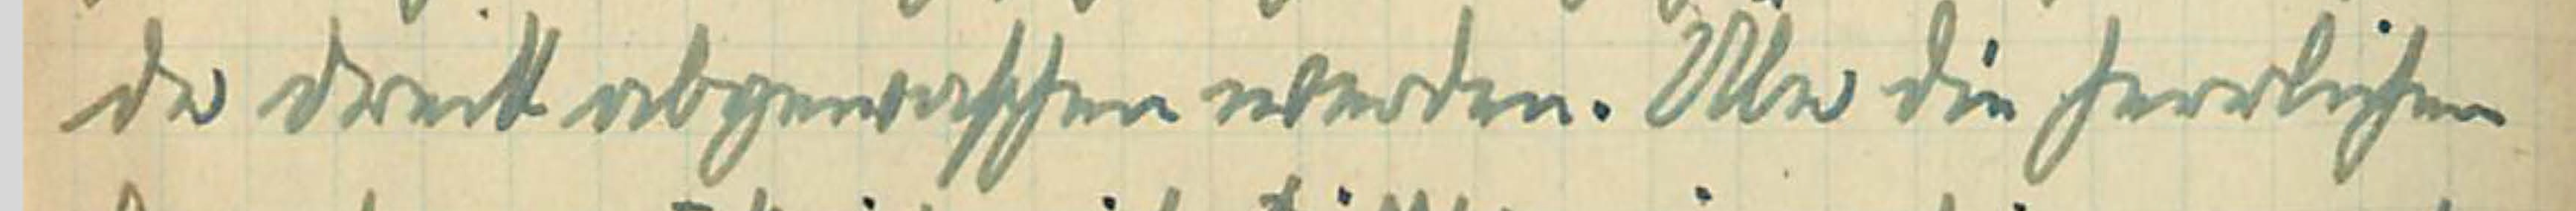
der Dreck abgewaschen werden. Über die herrlichen
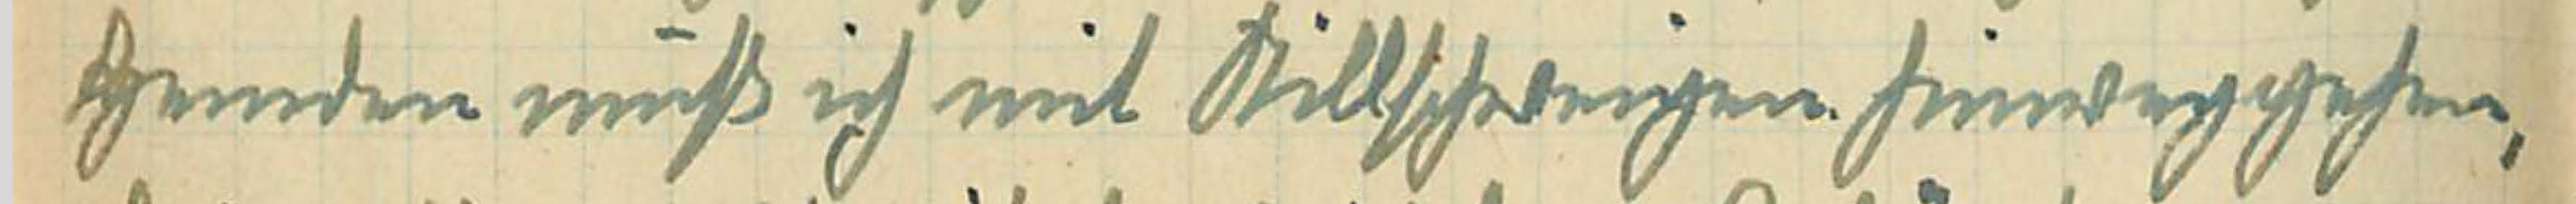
Hemden muß ich mit Stillschweigen hinweggehen,
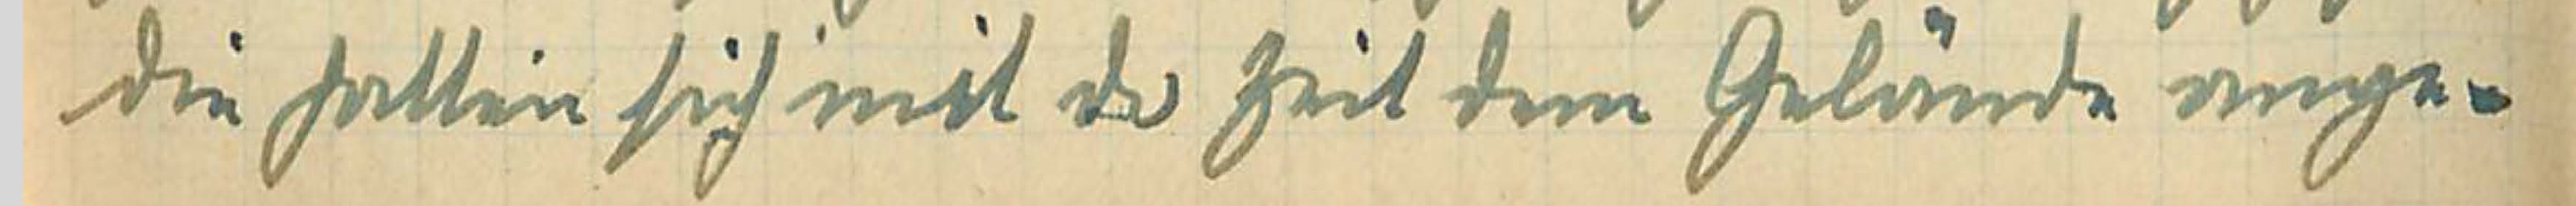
die hatten sich mit der Zeit dem Gelände ange-
